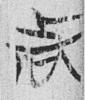者
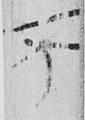不
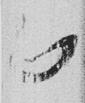㠯（以）
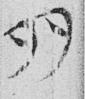多
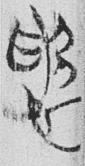○（務）
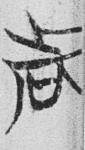者
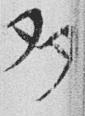多
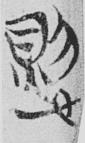賊
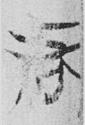者
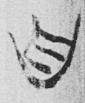自
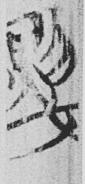賊
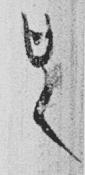也
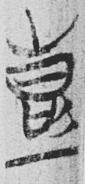彭
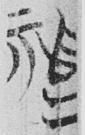祖
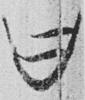曰
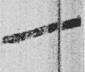一
